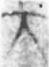大
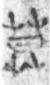莫
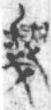囂（敖）
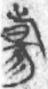○（陽）
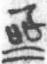爲
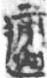適
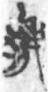豧
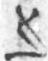之
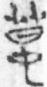○（春）
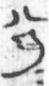八月
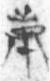庚
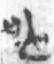申
